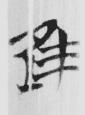隼
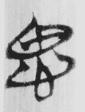思
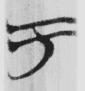于
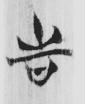告
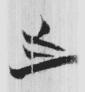之
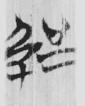{弓口二}
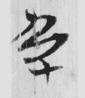弓
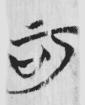可
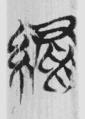縵
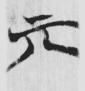亓
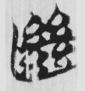㡭
